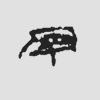群
